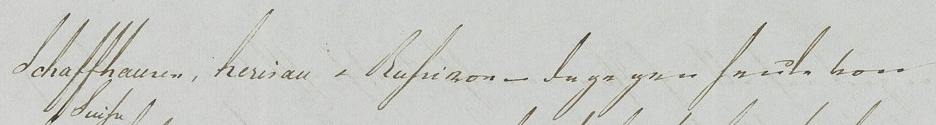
Herisau & Russikon – dagegen heute von
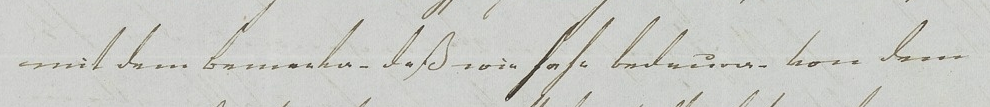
mit dem Bemerken – daß wir sehr bedauern von dem
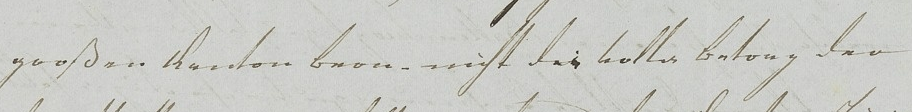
großen Kanton Bern nicht den halben Betrag der
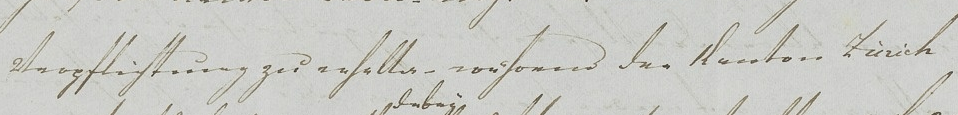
Verpflichtung zu erhalten – während der Kanton Zürich
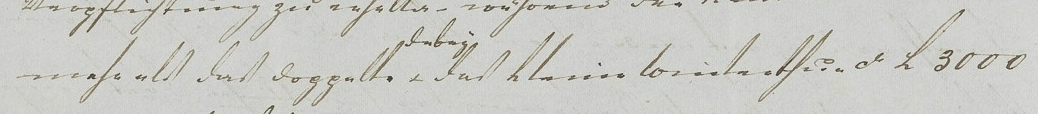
mehr als das doppelte & dabey das kleine Winterthur L 3000
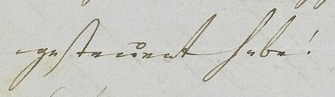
gesteuert habe!
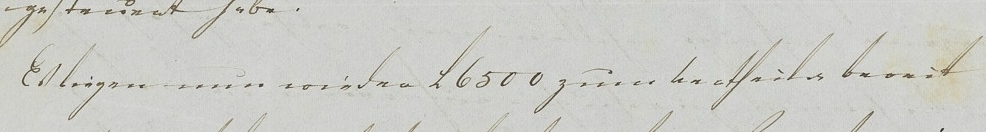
Es liegen nun von den L 6500 zum vertheilen bereit
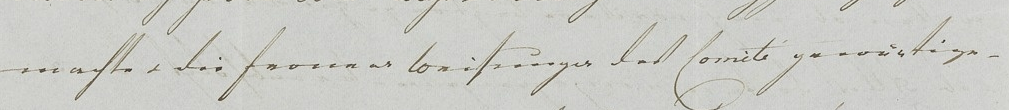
machte & die fernern Weisungen des Comité gewärtige –
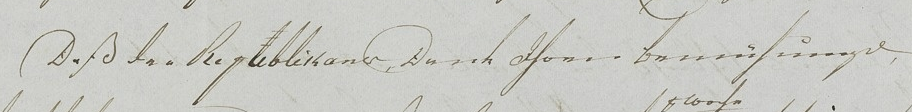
Daß der Republikaner, Dank Ihren Bemühungen,
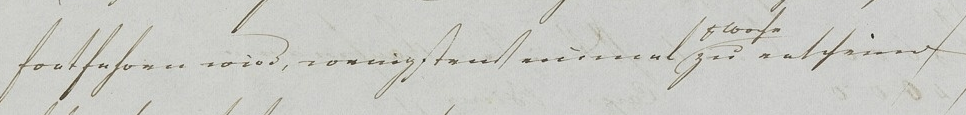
fortfahren wird, wenigstens einmal p Woche zu erscheinen
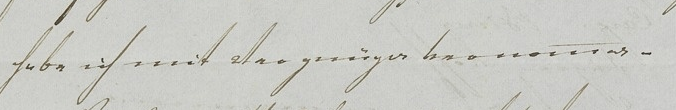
habe ich mit Vergnügen vernommen –
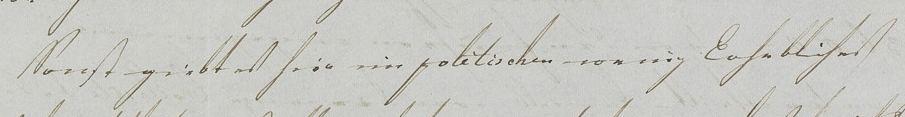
Sonst gibt es hier im politischen wenig Erhebliches
